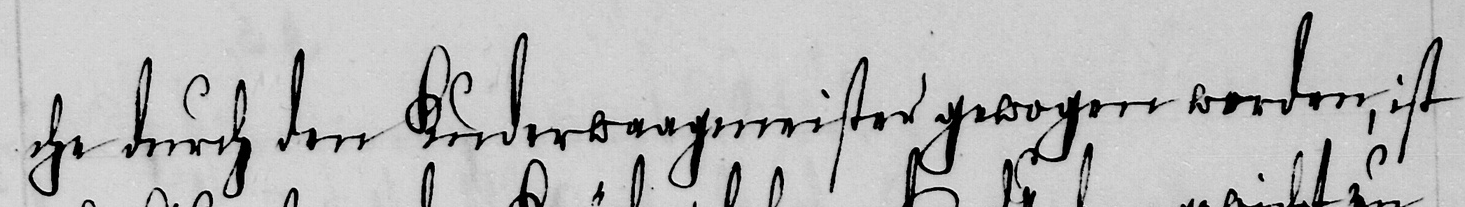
che durch den Kuderwaagemeister gewogen werden, ist
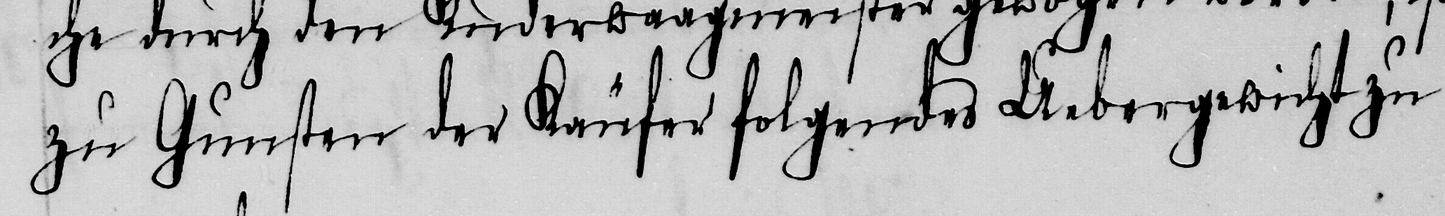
zu Gunsten der Käufer folgendes Uebergewicht zu
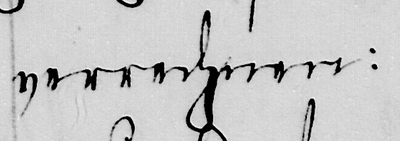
verrechnen:
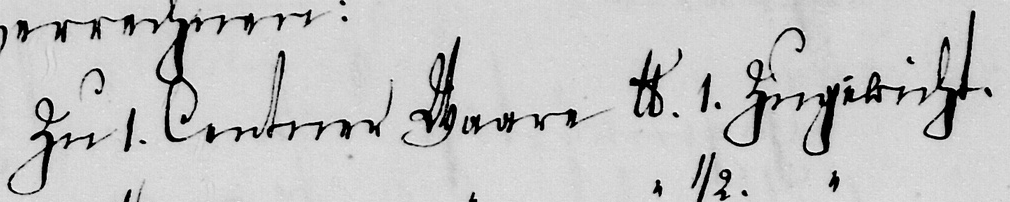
Zu 1. Centner Waare lb. 1. Zugewicht.
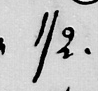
1/2.
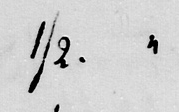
1/4.
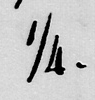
4.
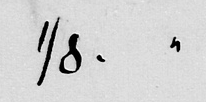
10.
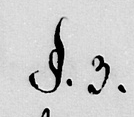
§. 3.
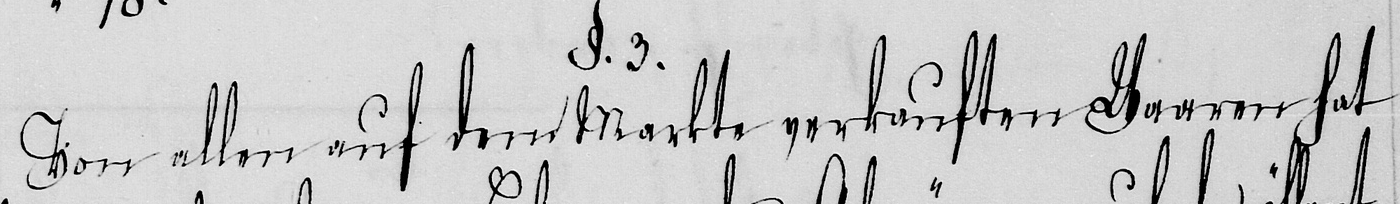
Von allen auf dem Markte verkauften Waaren hat
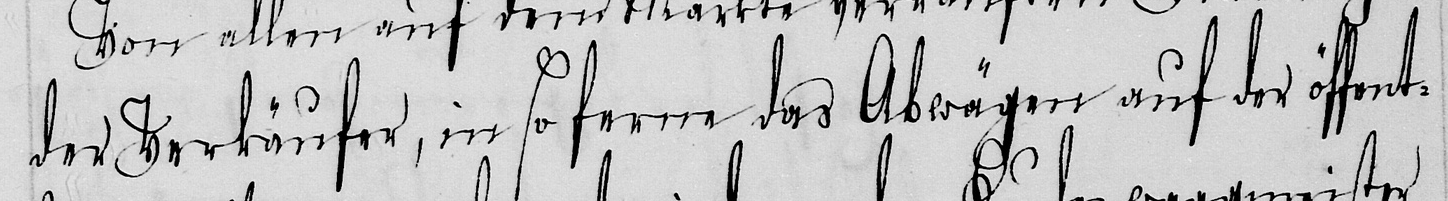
der Verkäufer, insoferne das Abwägen auf der öffen¬
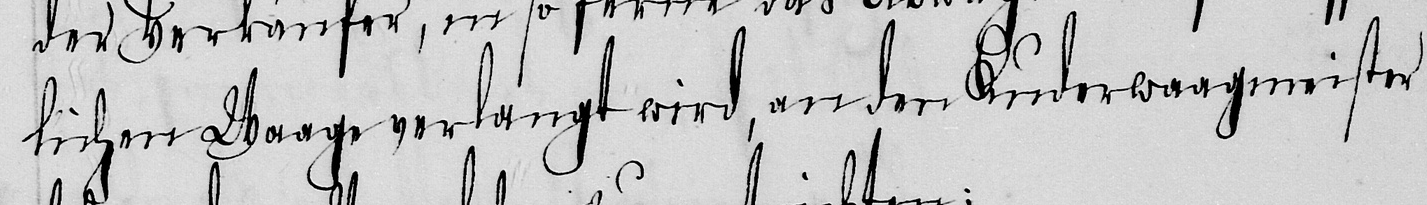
tlichen Waage verlangt wird, an den Kuderwaagmeister
